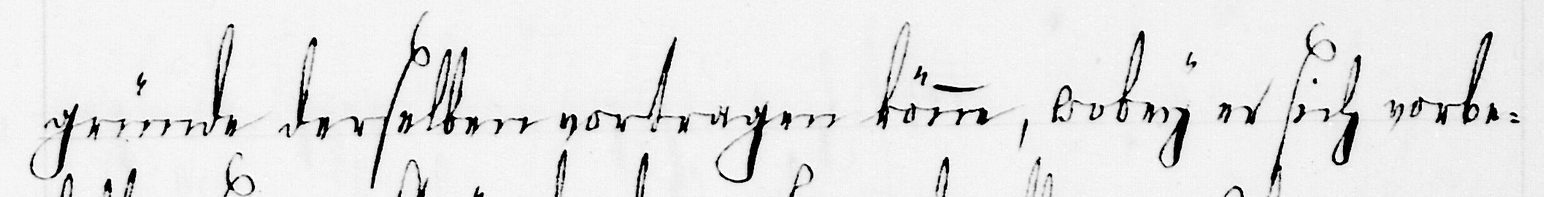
gründe derselben vortragen könne, wobey er sich vorbe¬
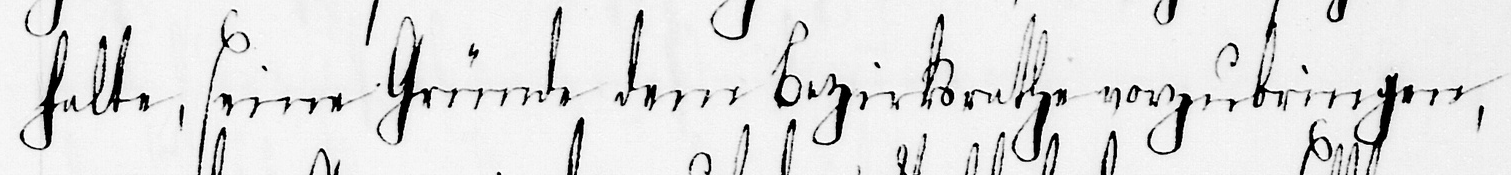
halte, seine Gründe dem Bezirksrathe vorzubringen,
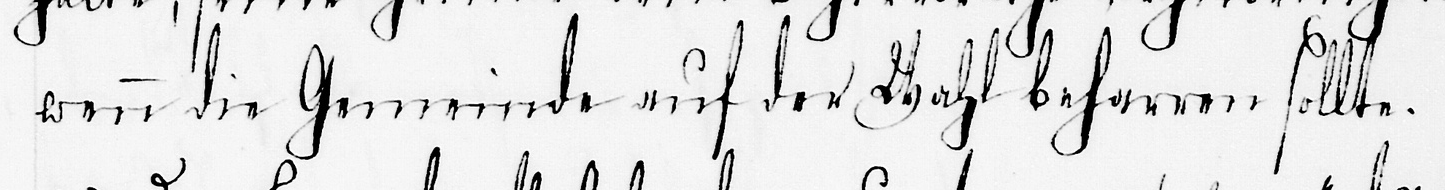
wenn die Gemeinde auf der Wahl beharren sollte.
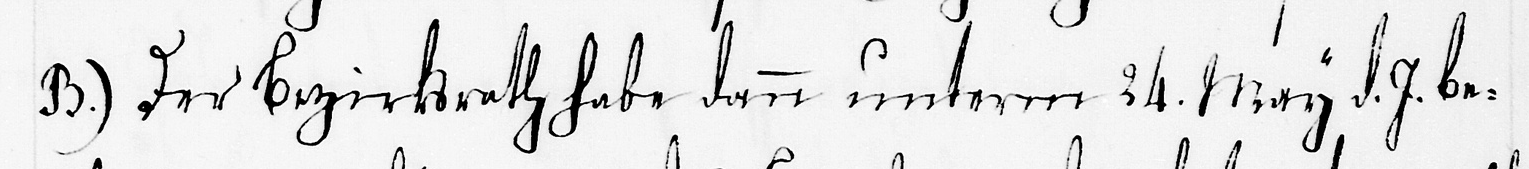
B.) Der Bezirksrath habe dann unterm 24. May d. J. be¬
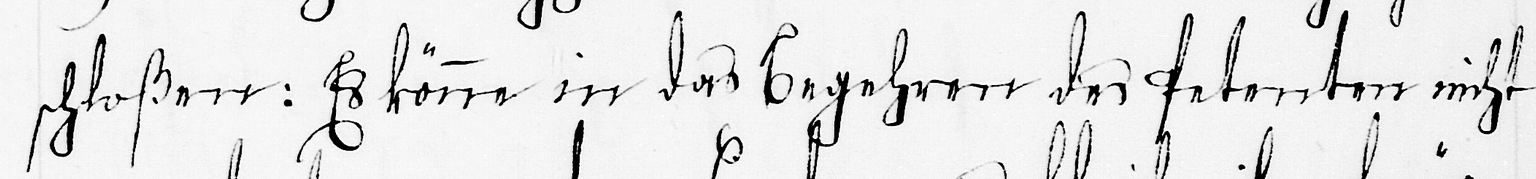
schloßen: Es könne in das Begehren des Petenten nicht
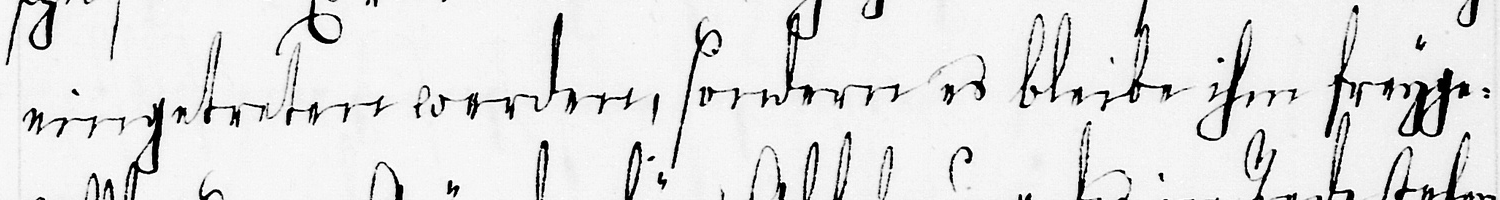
eingetreten werden, sondern es bleibe ihm freyges¬
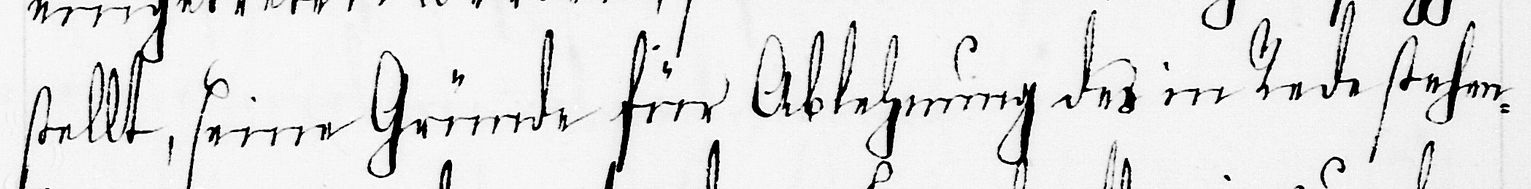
tellt, seine Gründe für Ablehnung des in Rede stehen¬
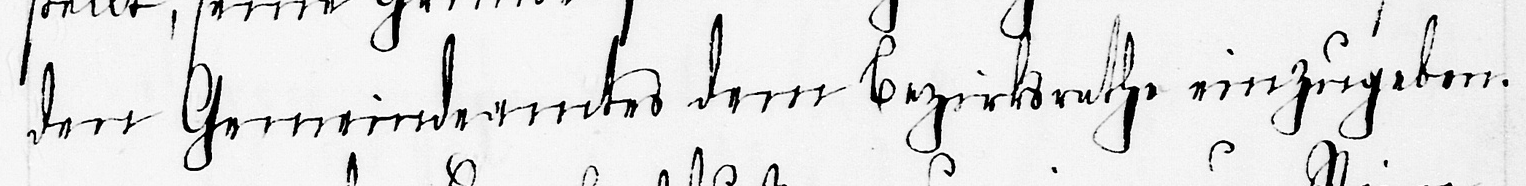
den Gemeindeamtes dem Bezirksrathe einzugeben.
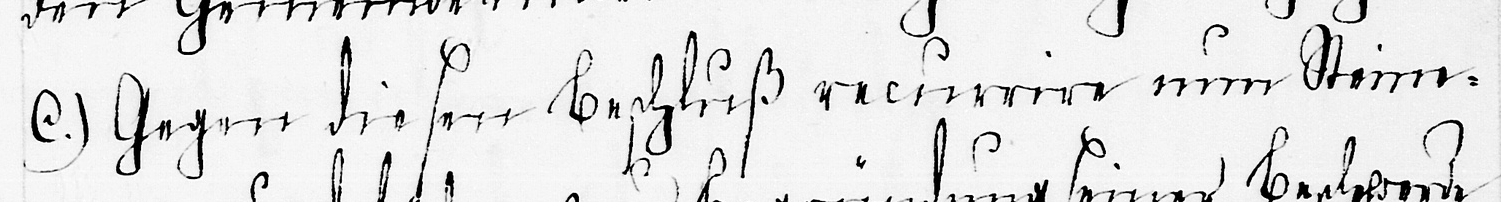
C.) Gegen diesen Beschluß recurrire nun Steine¬
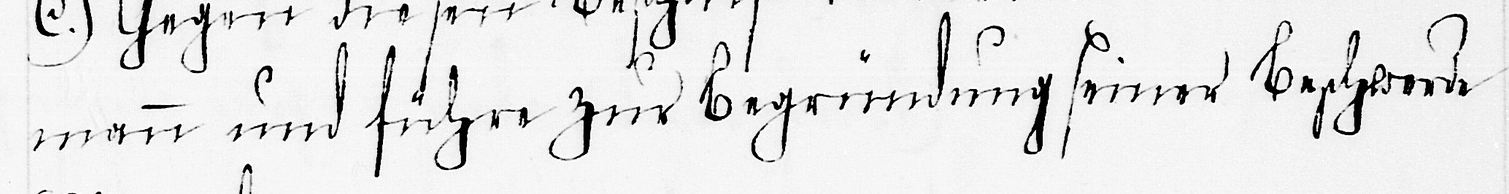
mann und führe zur Begründung seiner Beschwerde
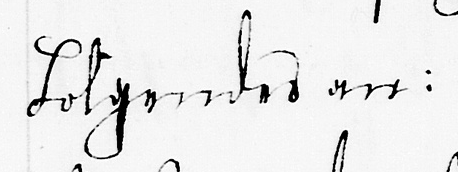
Folgendes an:
